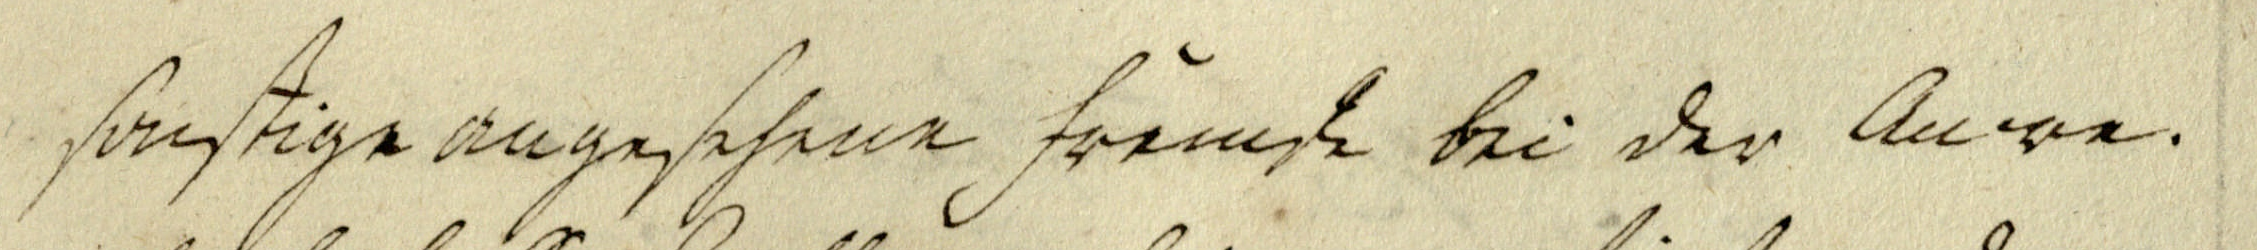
sonstige angesehene Fremde bei der Anwe¬
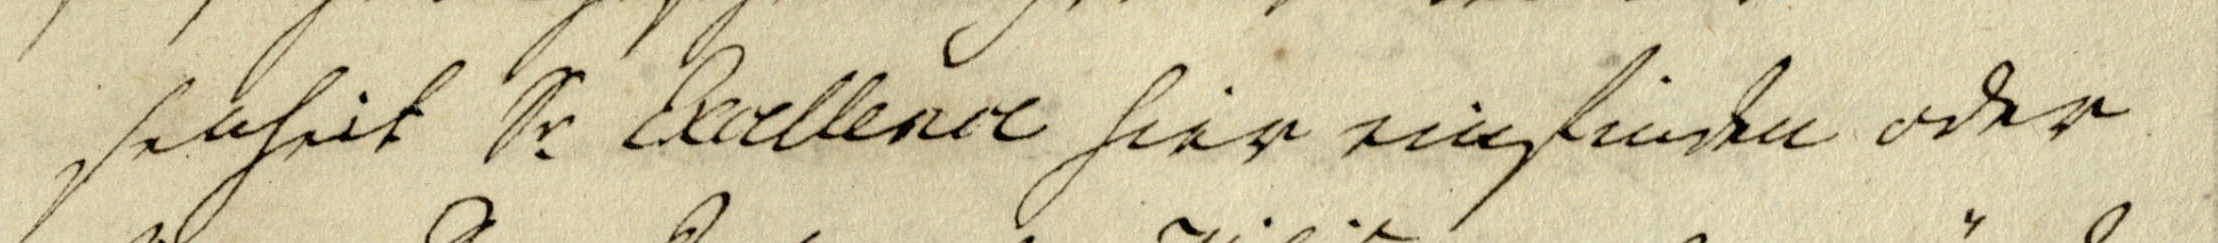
senheit Sr Excellence hier einfinden oder
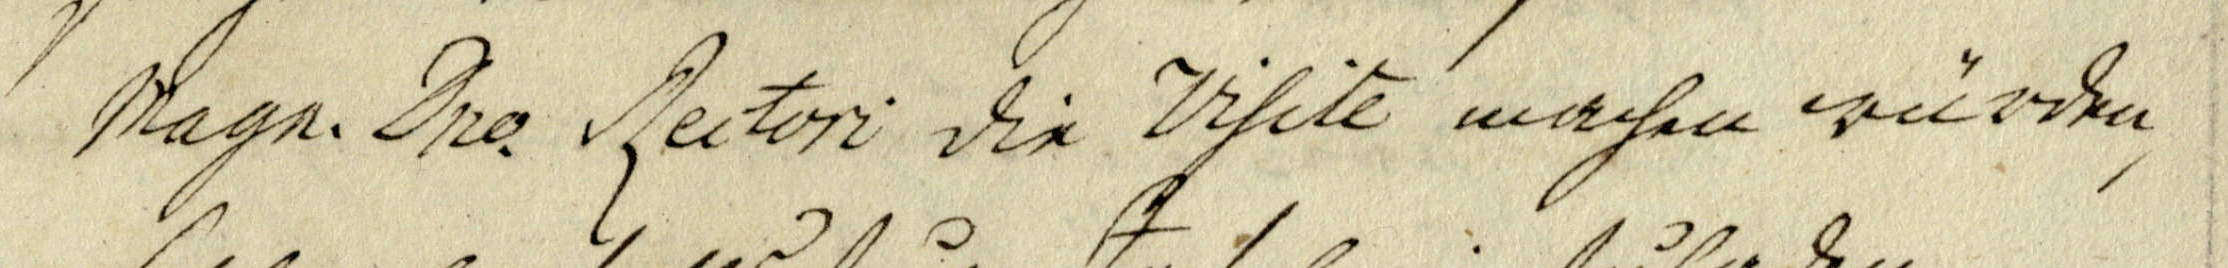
Magn. Dno. Rectori Visite machen würden,
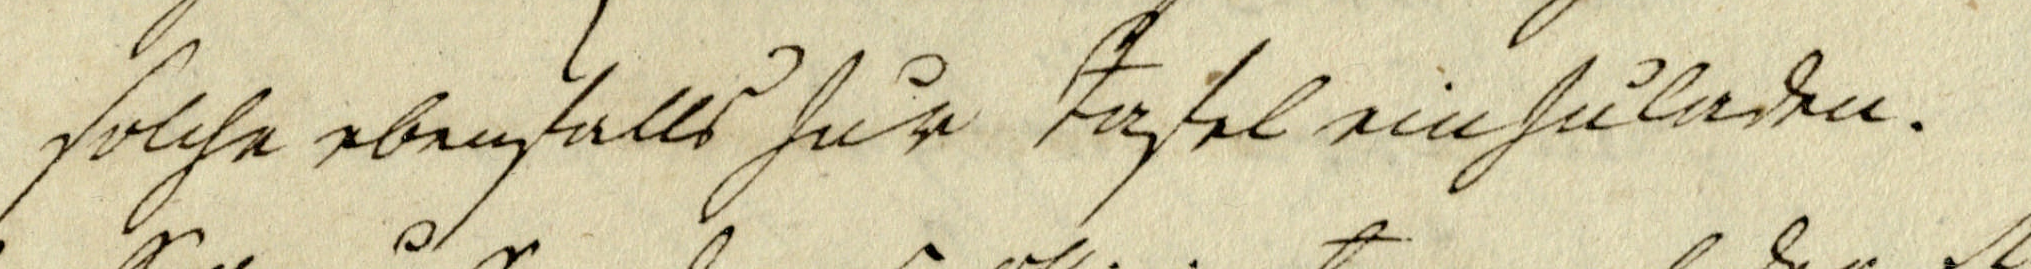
solche ebenfalls zur Tafel einzuladen.
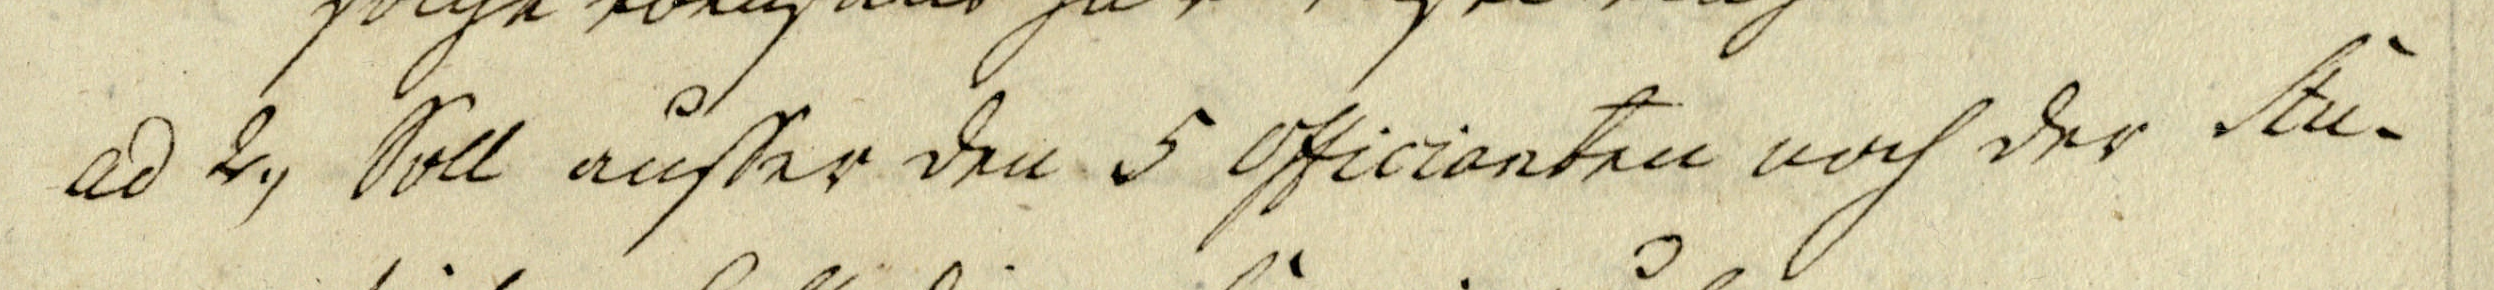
ad 2., Soll ausser den 5 Officianten noch der Stu¬
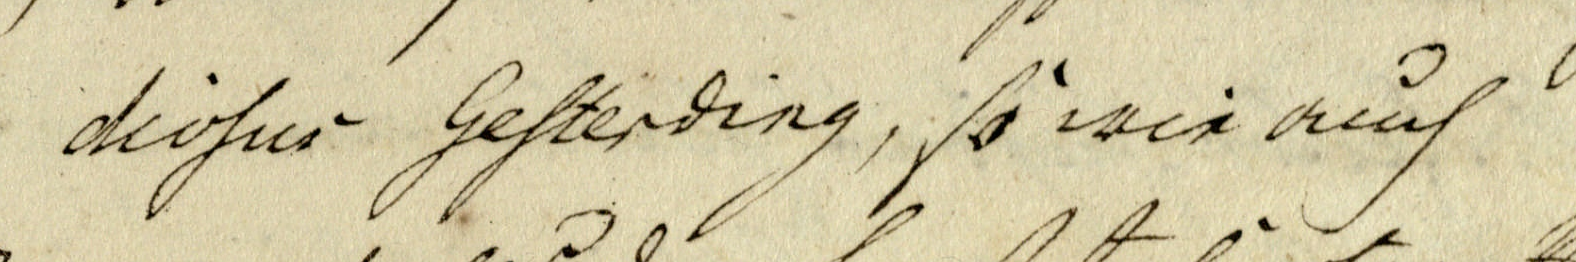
diosus Gesterding, so wie auch
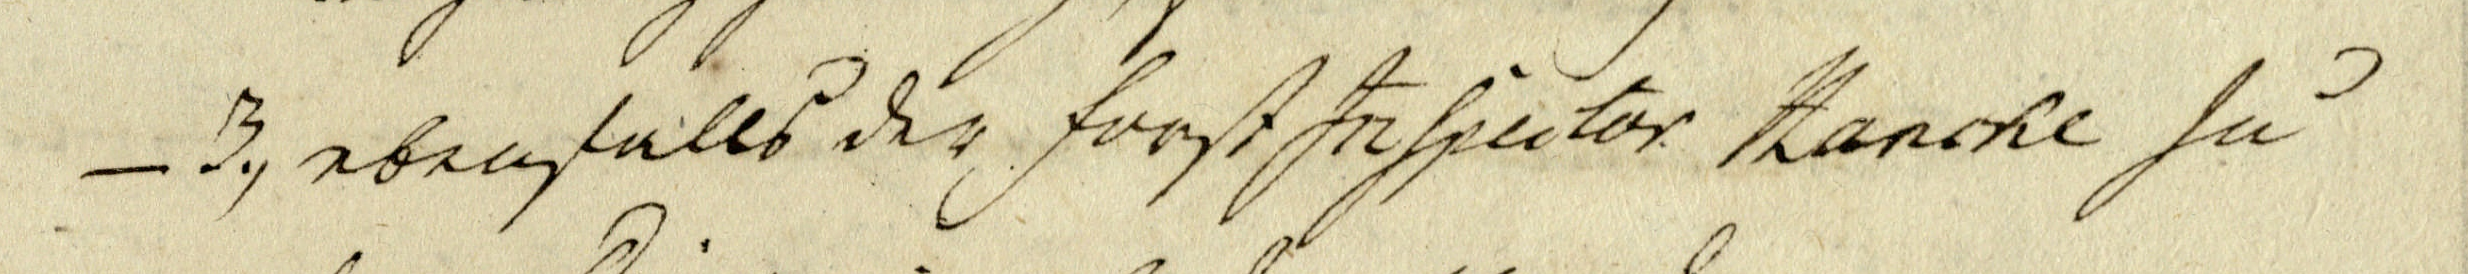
3., ebenfalls der Forst Inspector Hancke zu
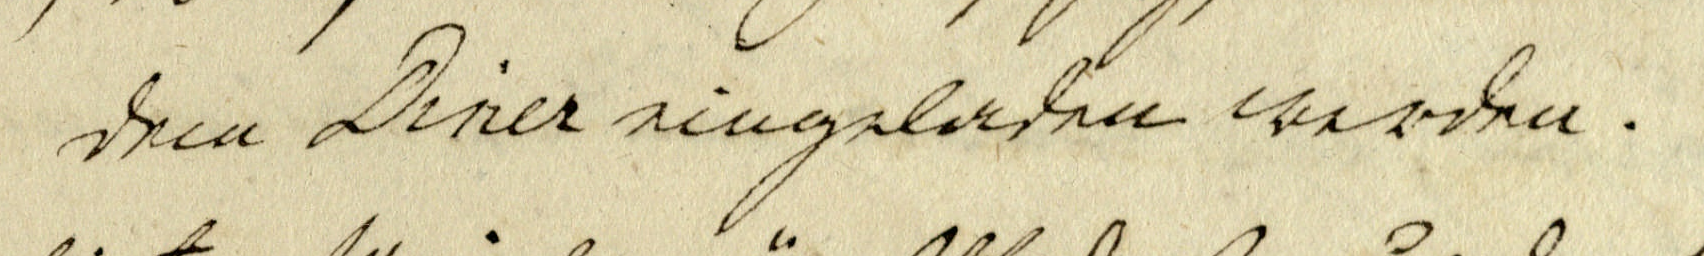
dem Diner eingeladen werden.
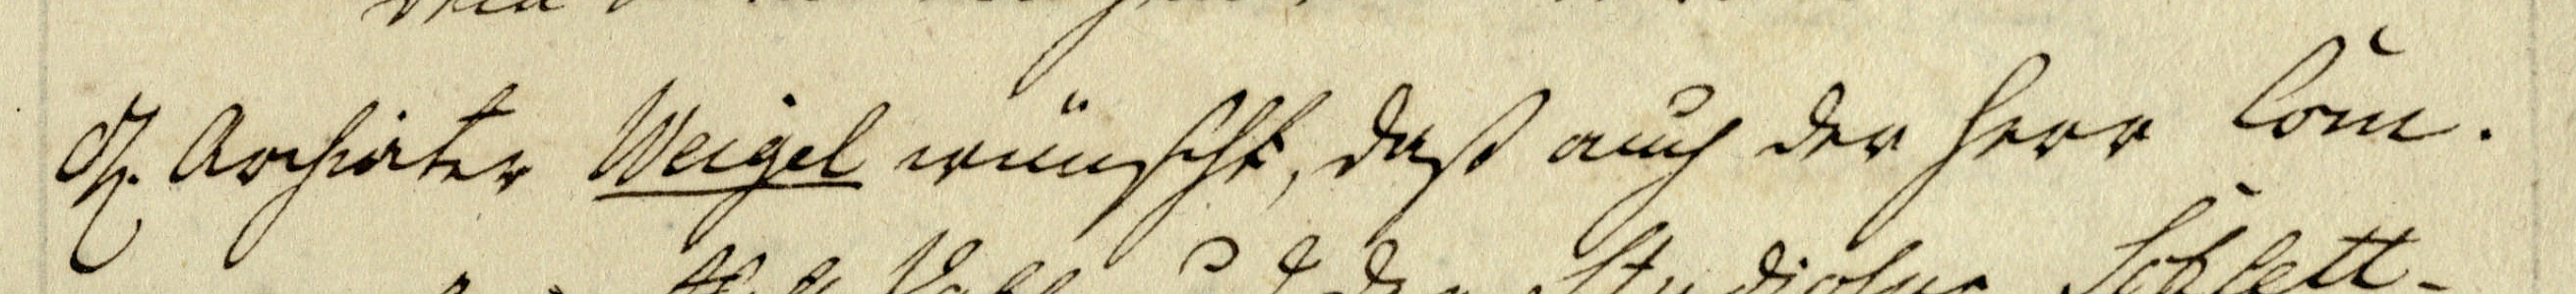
dh. Archiater Weigel wünscht, daß auch der Herr Com¬
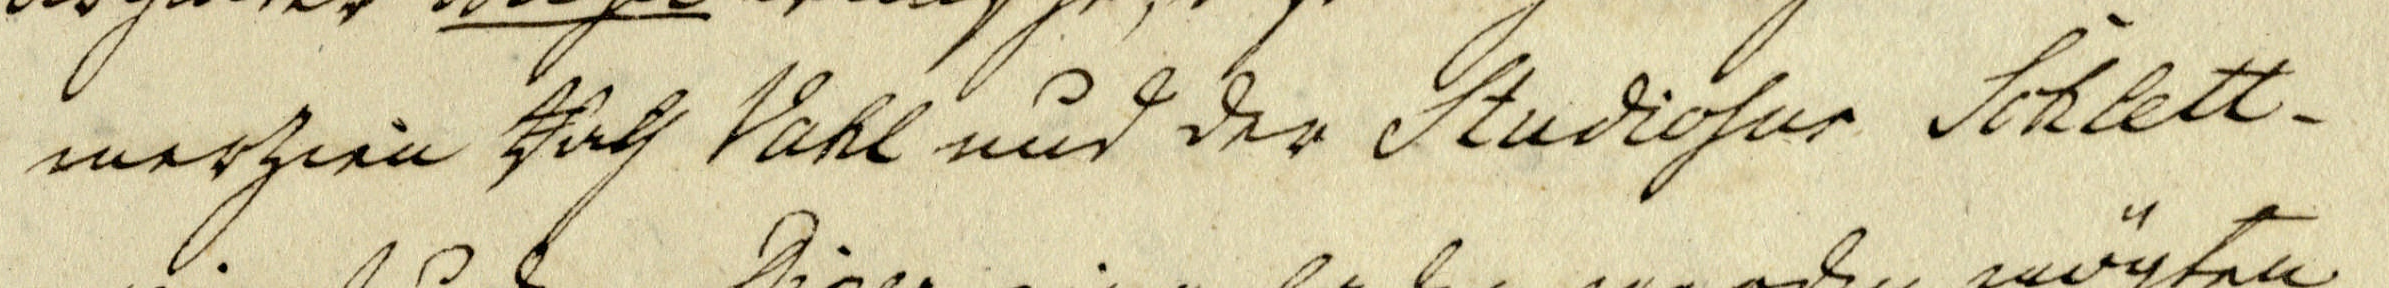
merzien Rath Vahl und der Studiosus Schlett¬
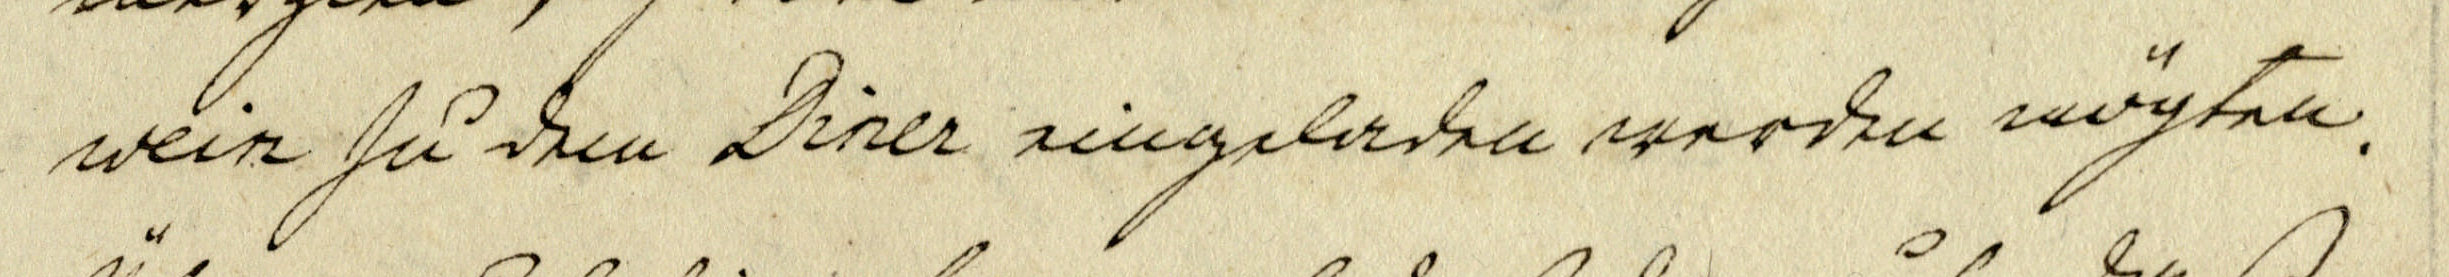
wein zu dem Diner eingeladen werden mögten.
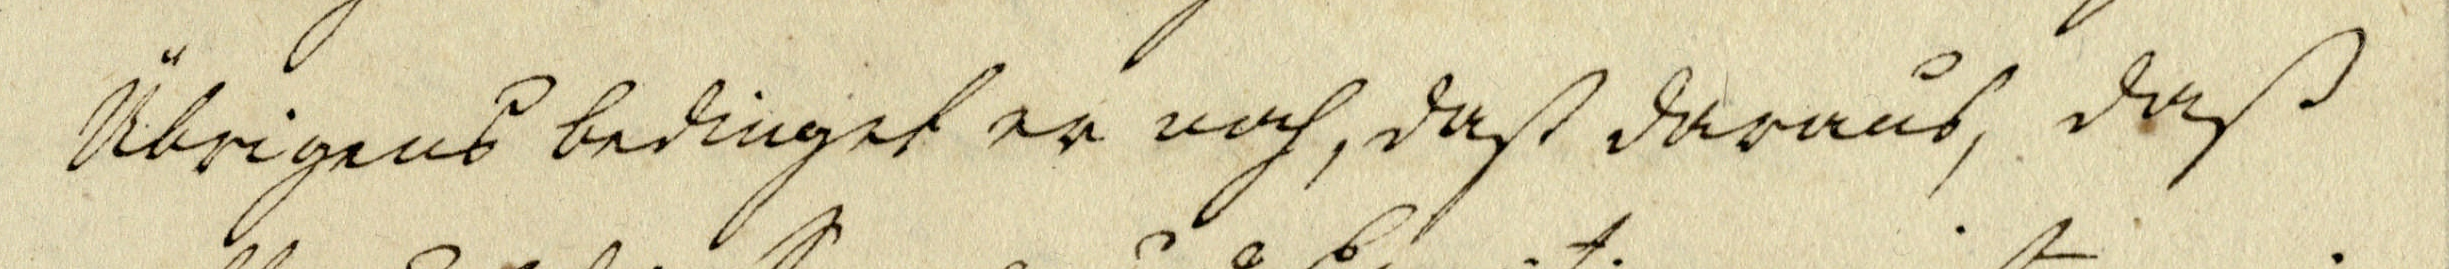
Übrigens bedinget er noch, daß daraus, daß
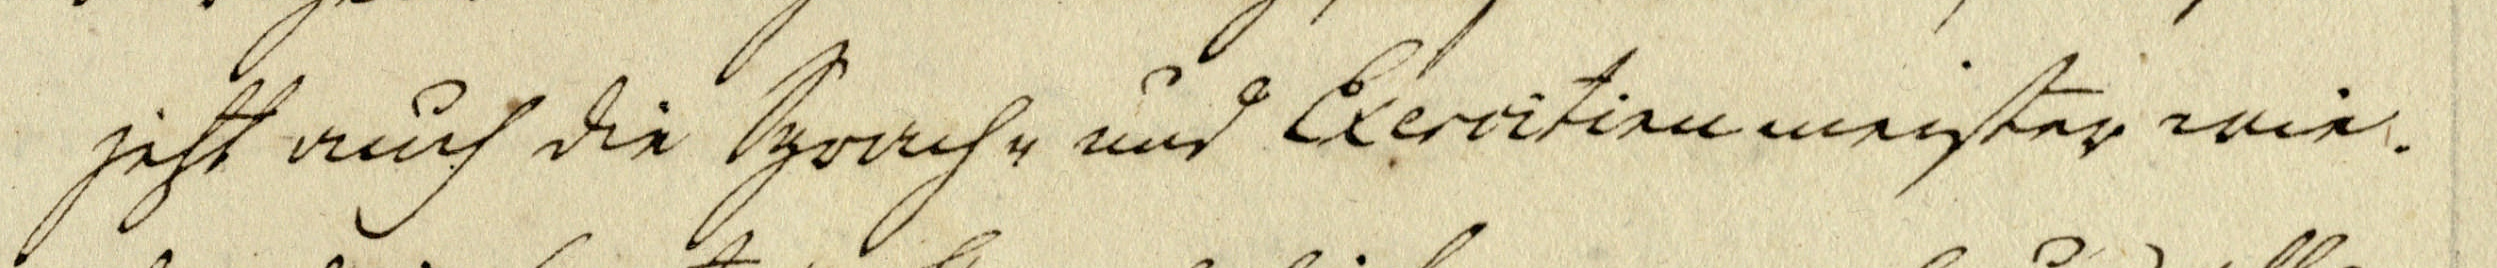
jetzt auch die Sprach- und Exercitienmeister wie¬
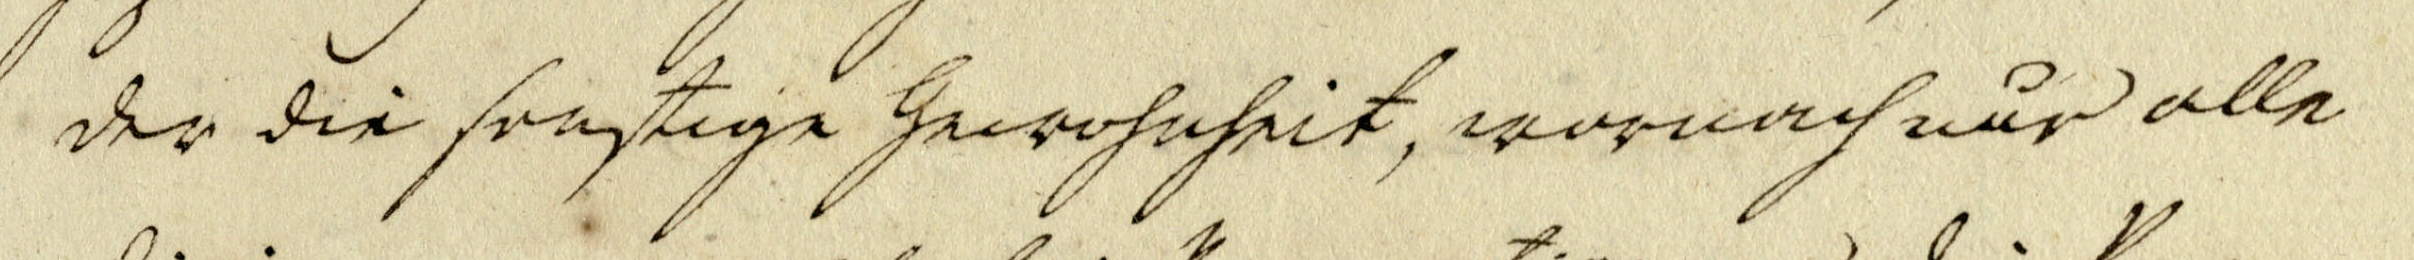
der die sonstige Gewohnheit, wornach nur alle
